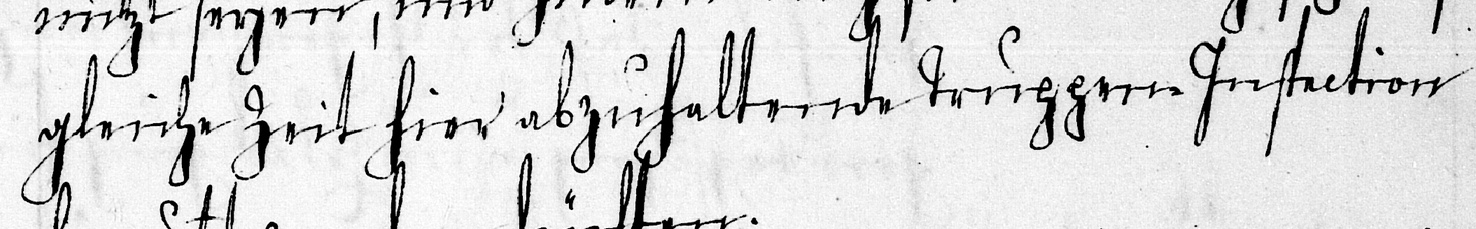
gleiche Zeit hier abzuhaltende Truppen-Inspection
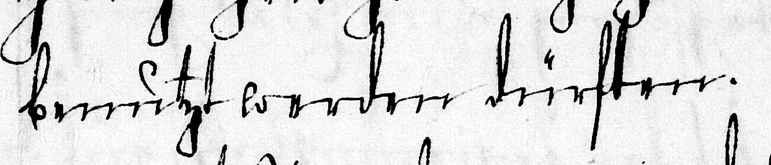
benutzt werden dürften.
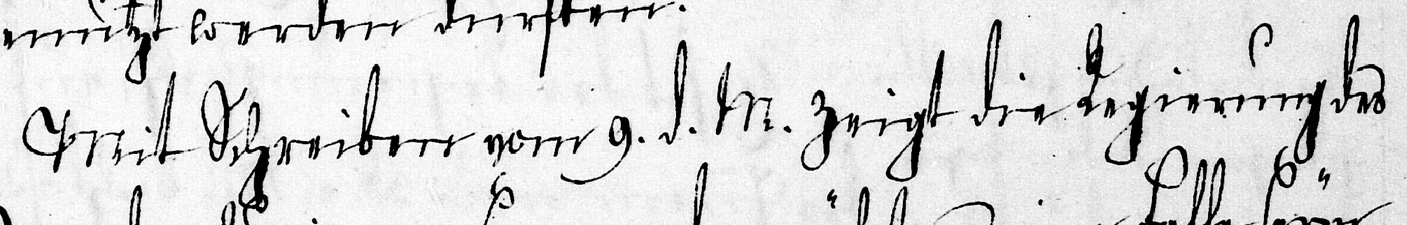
Mit Schreiben vom 9. d. M. zeigt die Regierung des
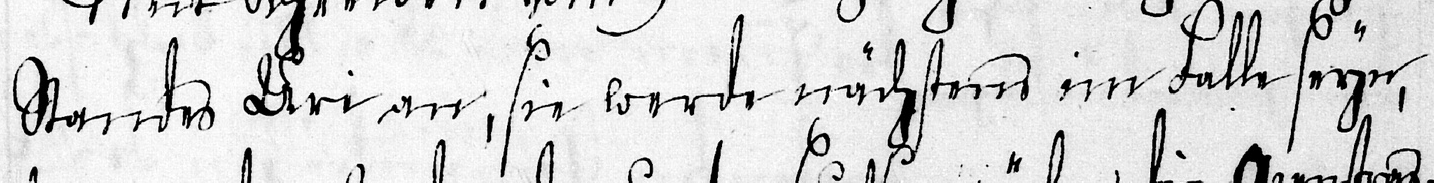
Standes Uri an, sie werde nächstens im Falle seyn,
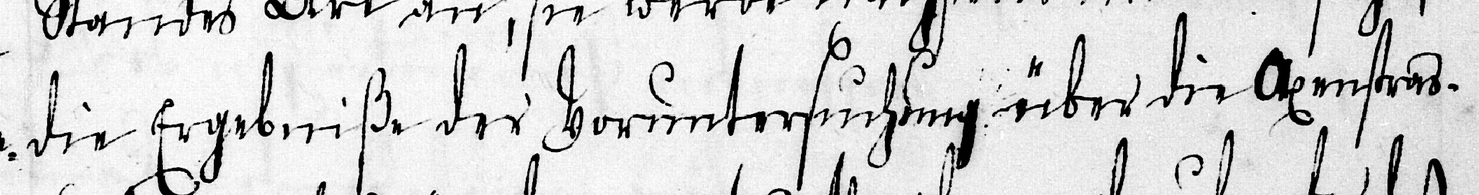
die Ergebniße der Voruntersuchung über die Axenstraß¬
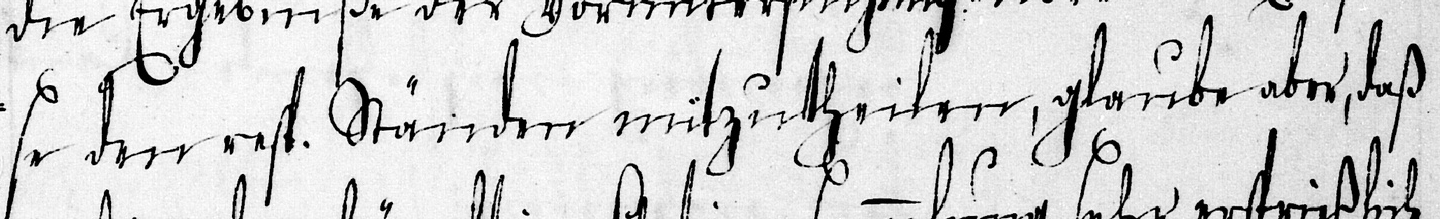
e den resp. Ständen mitzutheilen, glaube aber, daß
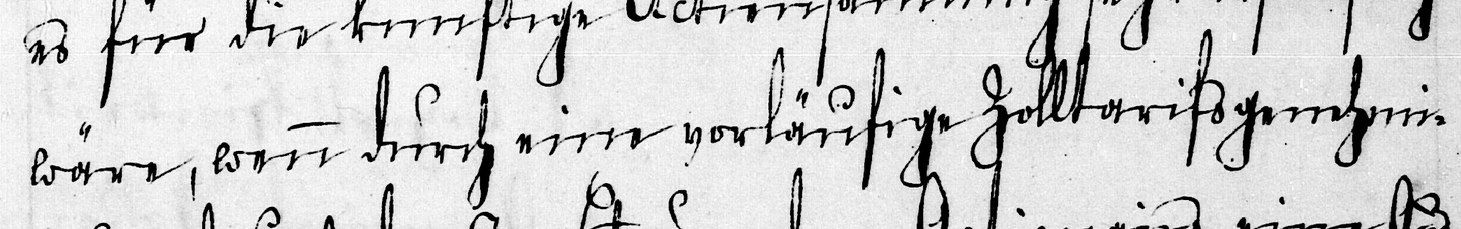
wäre, wenn durch eine vorläufige Zolltarifsgenehmi¬
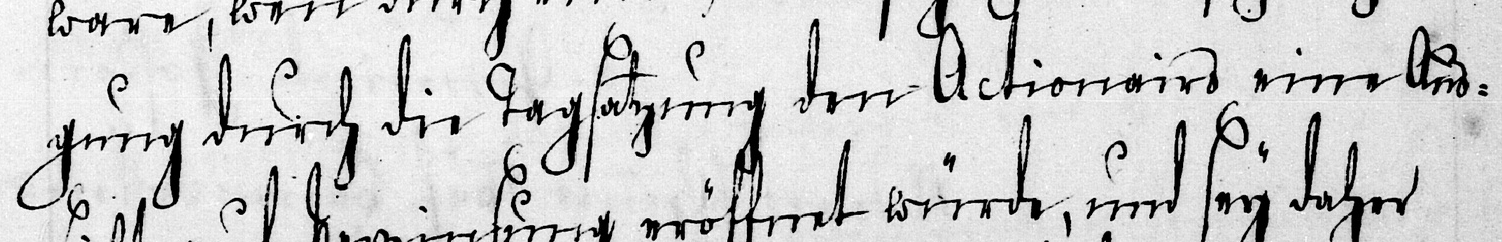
gung durch die Tagsatzung den Actionairs eine Aus¬
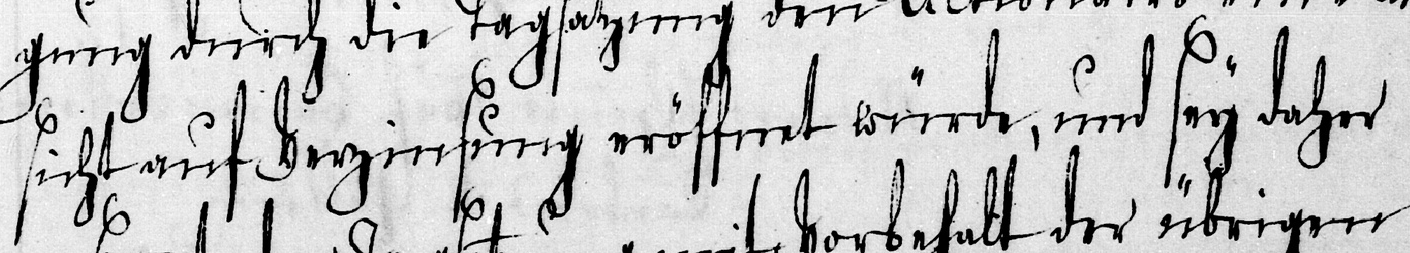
sicht auf Verzinsung eröffnet würde, und sey daher
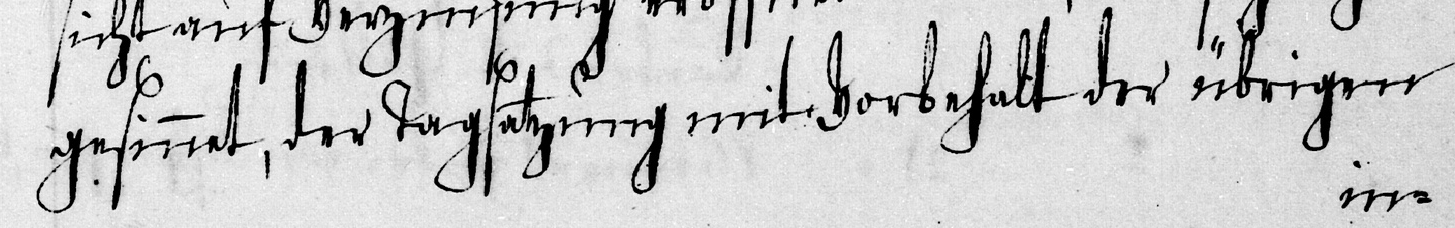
gesinnet, der Tagsatzung mit Vorbehalt der übrigen
